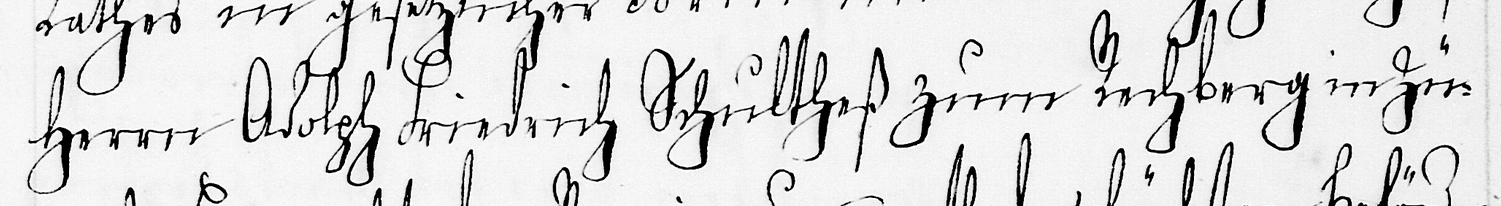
Herrn Adolph Friedrich Schultheß zum Rechberg in Zü¬
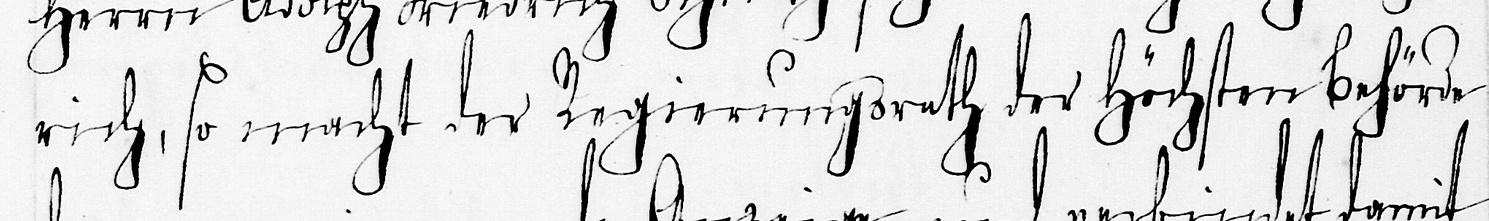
rich, so macht der Regierungsrath der Höchsten Behörde
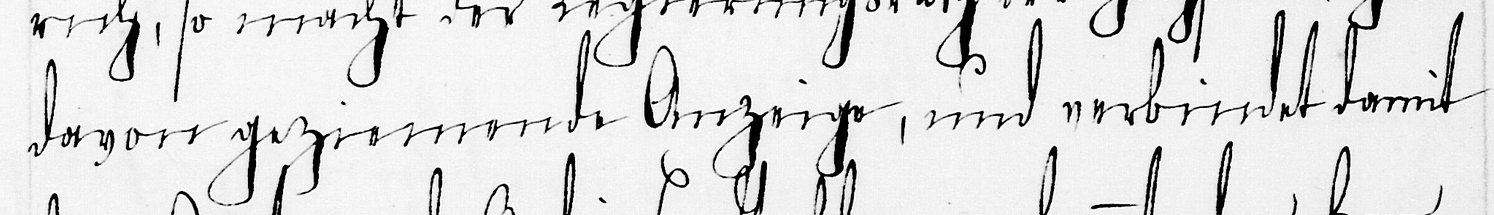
davon geziemende Anzeige, und verbindet damit
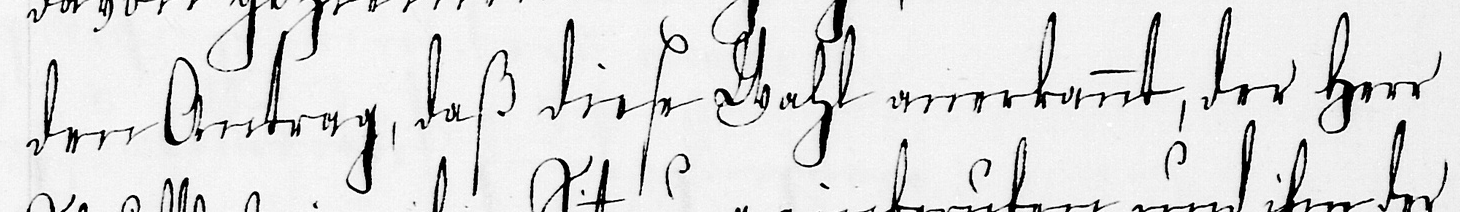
den Antrag, daß diese Wahl anerkannt, der Herr
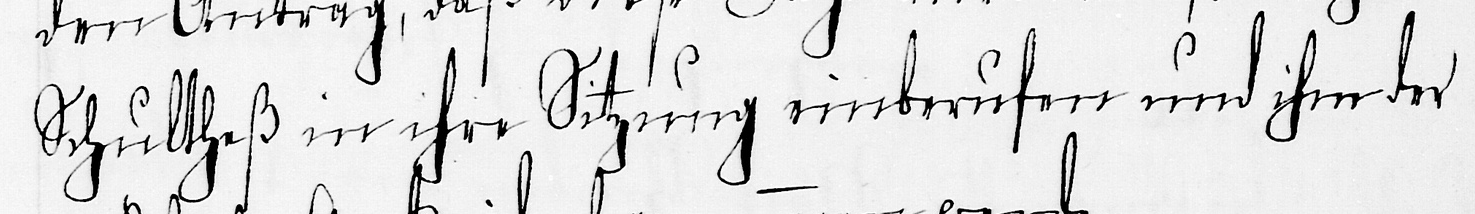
Schultheß in ihre Sitzung einberufen und ihm der
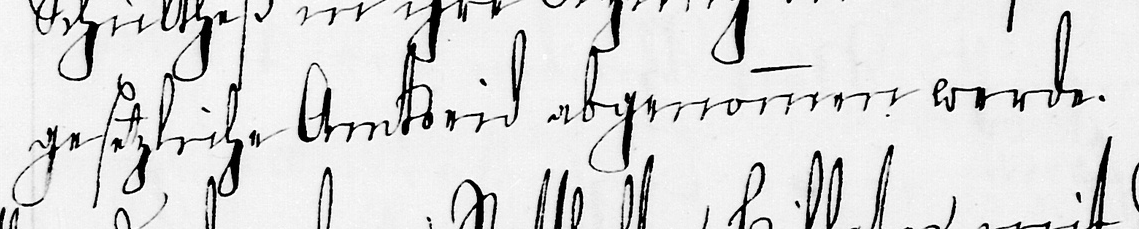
gesetzliche Amtseid abgenommen werde.
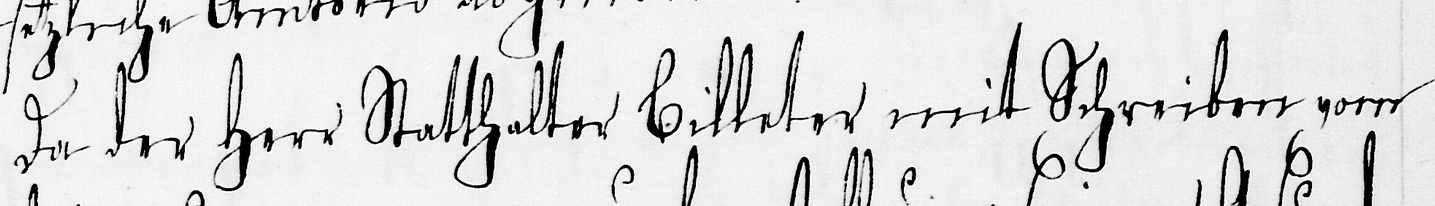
Da der Herr Statthalter Billeter mit Schreiben vom
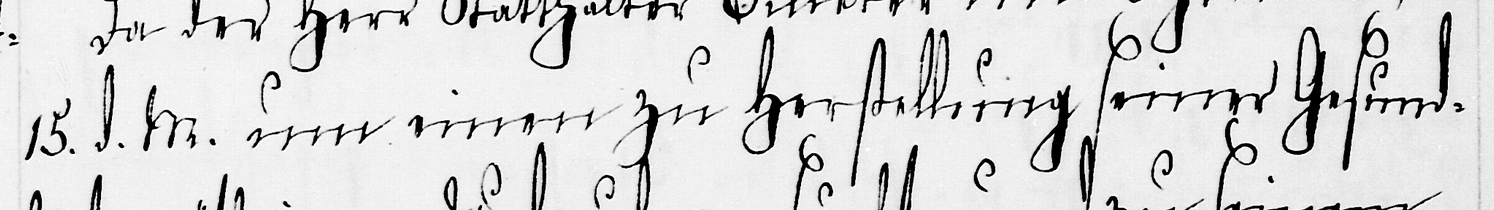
15. d. M. um einen zu Herstellung seiner Gesund¬
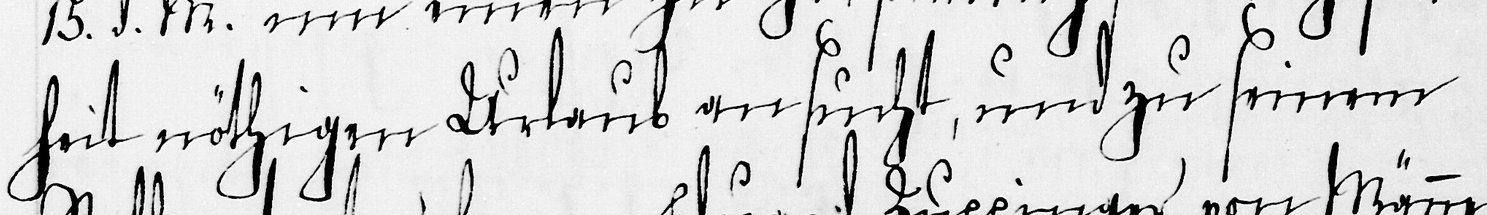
heit nöthigen Urlaub ansucht, und zu seinem
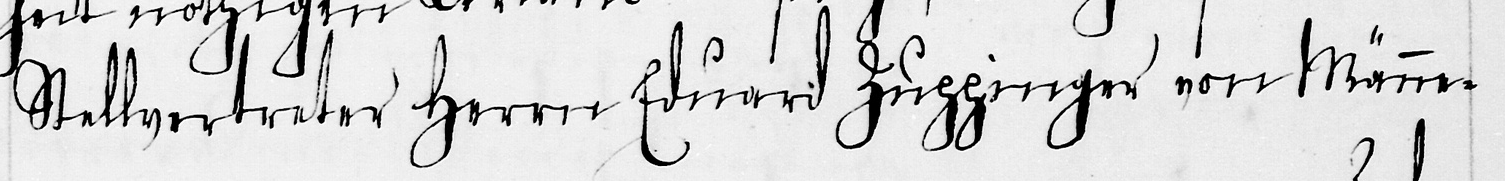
Stellvertreter Herrn Eduard Zuppinger von Männe-
